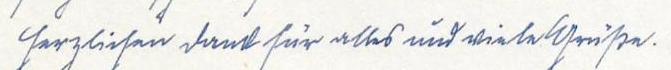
Herzlichen Dank für alles und viele Grüße.
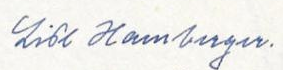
Liesl Hamberger
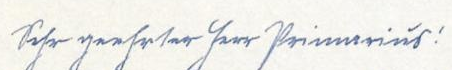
Sehr geehrter Herr Primarius!
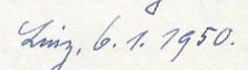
Linz 6.1.1950.
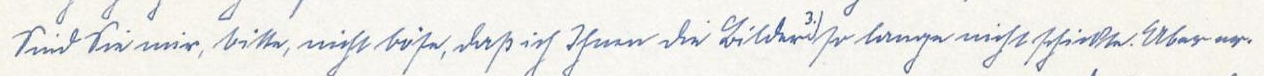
Sind Sie mir, bitte, nicht böse, dass ich Ihnen die Bilder so lange nicht schickte. Aber er
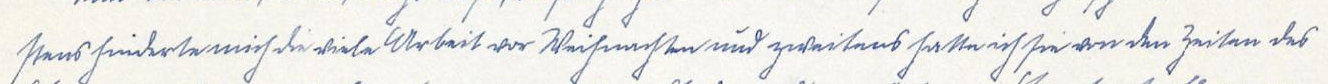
stens hinderte mich die viele Arbeit vor Weihnachten und zweitens halte ich sie von den Zeiten des
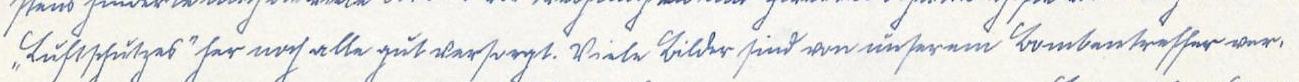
„Luftschutzes“ her noch alle gut versorgt. Viele Bilder sind von unserem Bombentreffer ver
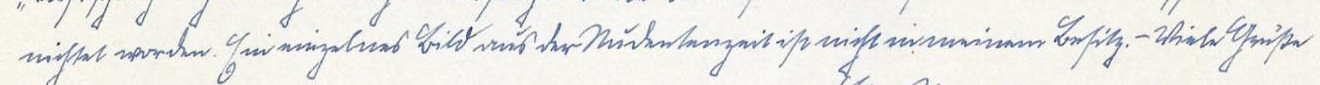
nichtet worden. Ein einzelnes Bild aus der Studentenzeit ist nicht in meinem Besitz. - Viele Grüße
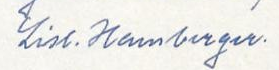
Lisl Hamberger
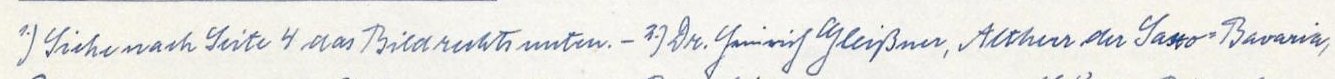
1) Siehe nach Seite 4 das Bild rechts unten.- 2) Dr. Heinrich Gleißner, Altherr der Saxo-Bavaria,
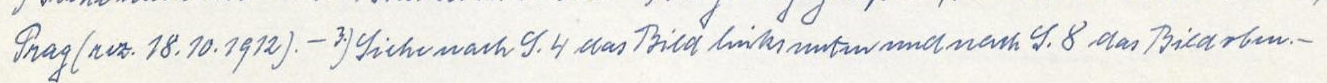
Prag (rez. 18.10.1912).- 3) Siehe nach S. 4 das Bild links unten und nach S. 8 das Bild oben.-
